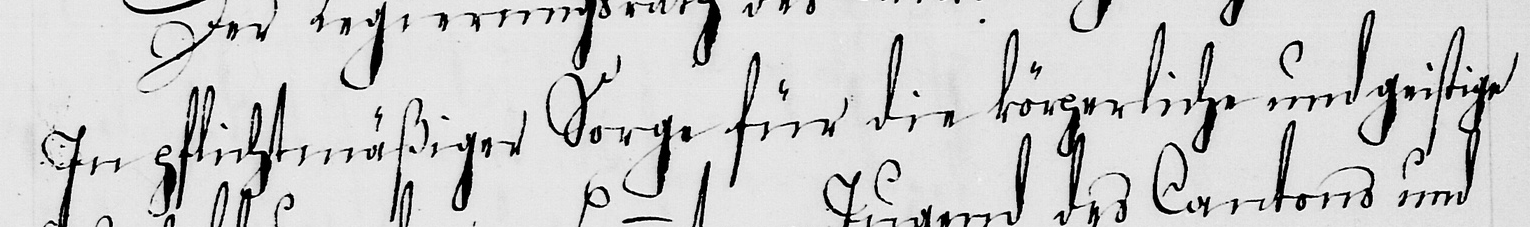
In pflichtmäßiger Sorge für die körperliche und geistige
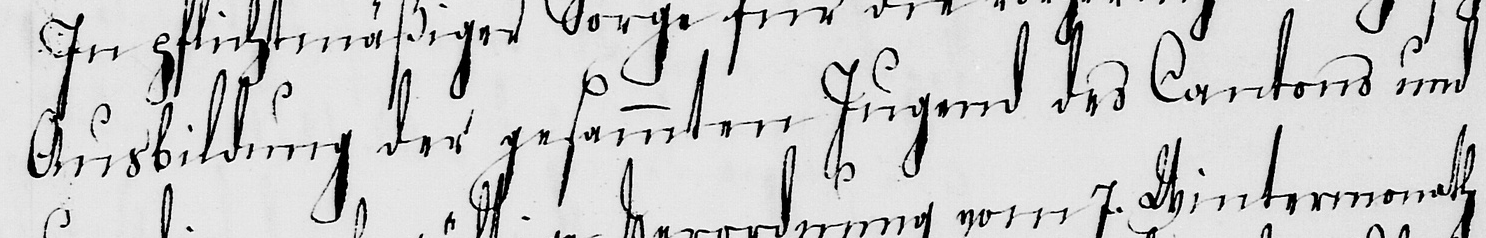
Ausbildung der gesammten Jugend des Cantons und
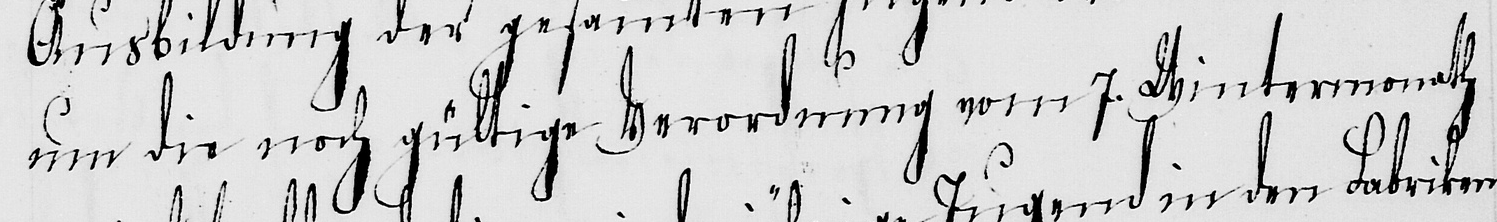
um die noch gültige Verordnung vom 7. Wintermonath
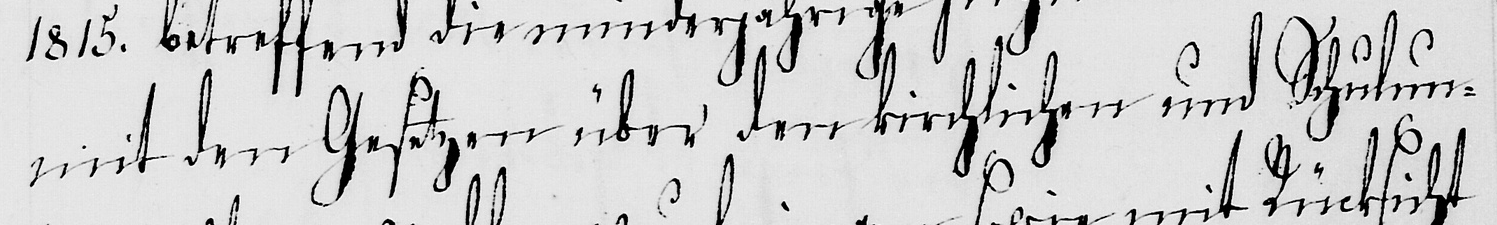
mit den Gesetzen über den kirchlichen und Schulun¬
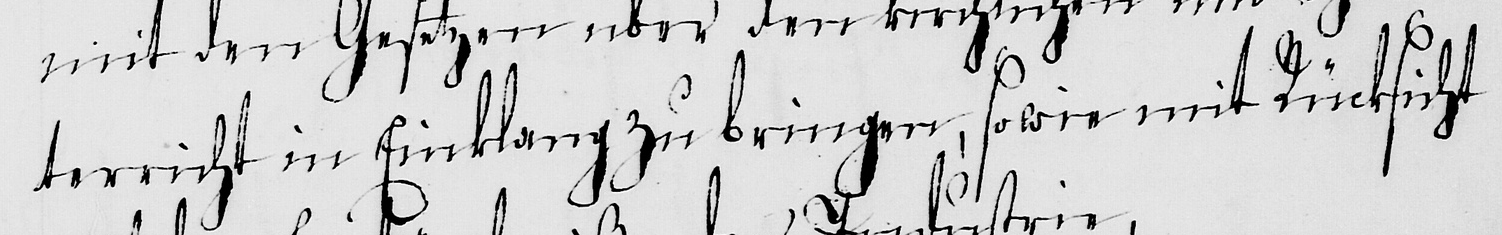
terricht in Einklang zu bringen, sowie mit Rücksicht
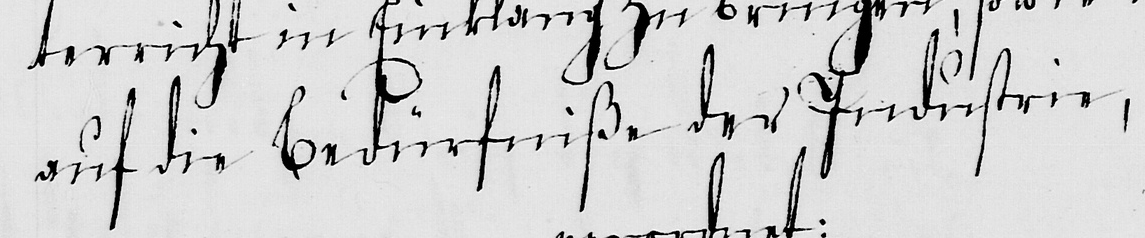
auf die Bedürfniße der Industrie,
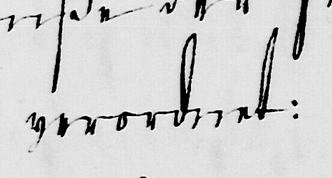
verordnet:
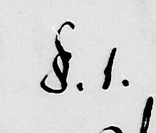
§. 1.
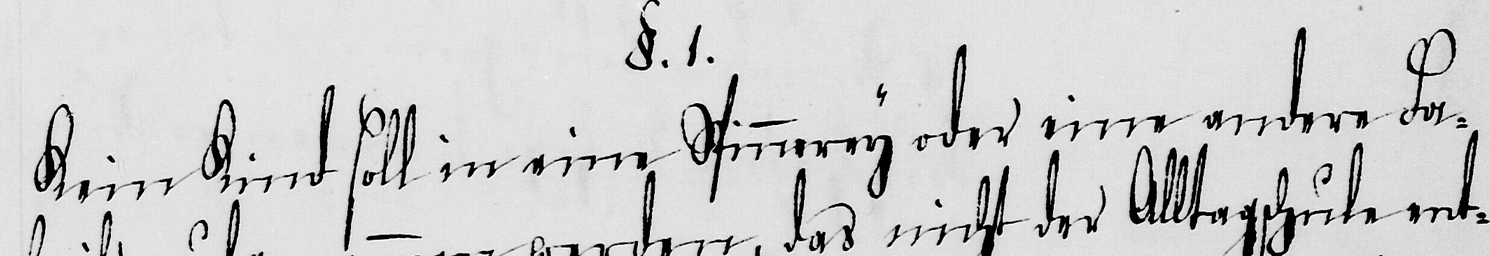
Kein Kind soll in eine Spinnerey oder eine andere Fa¬
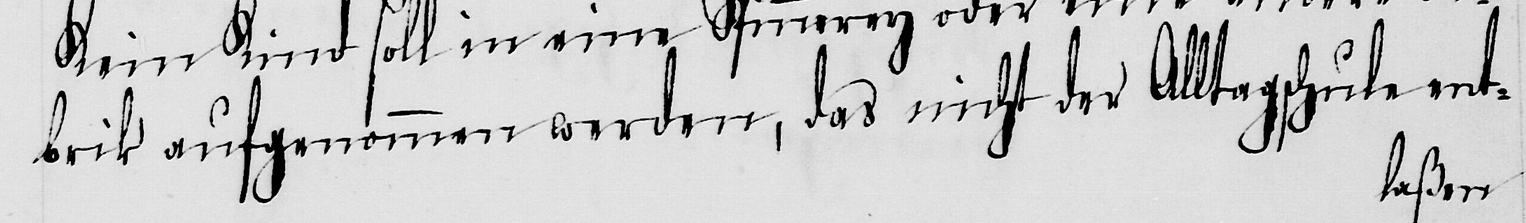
brik aufgenommen werden, das nicht der Alltagschule ent-
